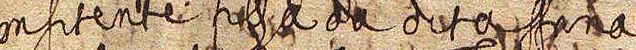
Confitente filha da dita Anna
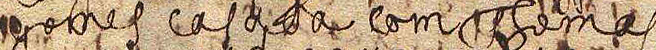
gomes casada com Thomas
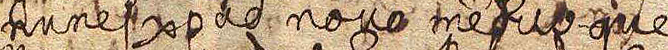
nunes xpaõ nouo medico que
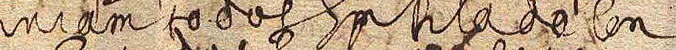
viuiam todos Em Vila do Con
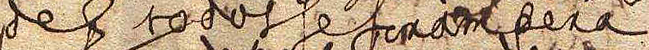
de E todos se foram pera
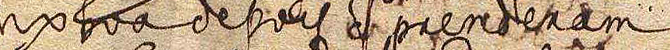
lixboa depois q̄ prenderam
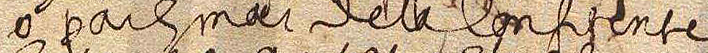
o pai E mai dela Confitente
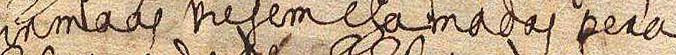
irmaās viesem chamadas pera
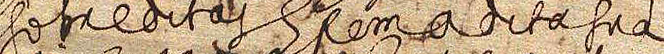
sobreditas E com a dita sua
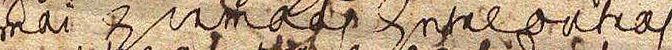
mai E irmaā Entre outras
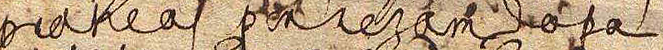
praticas por rezam do pa
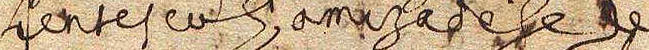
rentesco E amizade se de
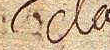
cla
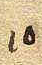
10
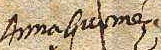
Anna Guomez̄
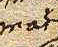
mai
